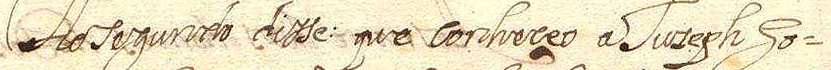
Ao segundo disse: que conheceo a Iuzeph Go
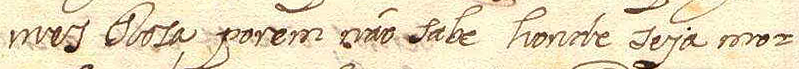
mes Roza, porem naõ sabe honde seja mo
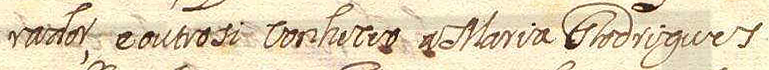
rador, e outrosi conheceo a Maria Rodrigues
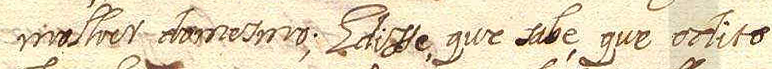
molher do mesmo; E disse, que sabe, que o dito
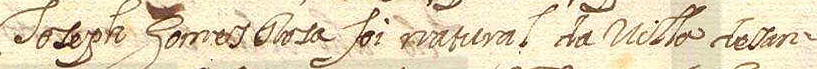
Iozeph Gomes Roza foi natural da Uilla de san
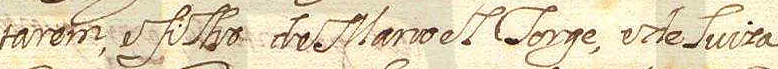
tarem, e filho de Manoel Iorge, e de Luiza
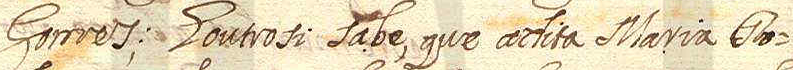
Gomes; E outrosi sabe, que a dita Maria Ro
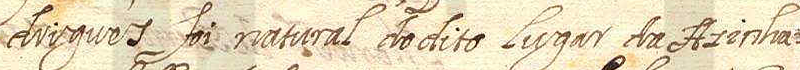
drigues foi natural do dito Lugar da Azinha
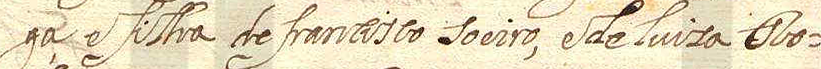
ga, e filha de francisco soeiro, e de Luiza Ro
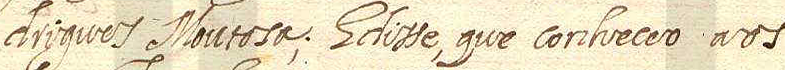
drigues Moutoza; E disse, que conheceo aos
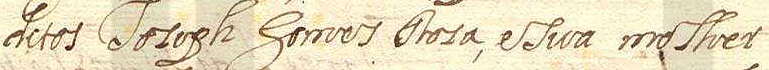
ditos Iozeph Gomes Roza, e sua molher
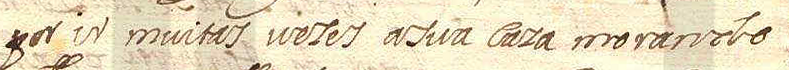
por ir muitas uezes a sua caza morando
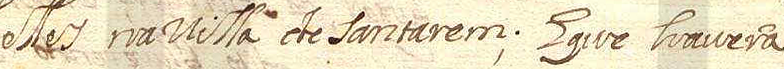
elles na uilla de Santarem; E que hauerā
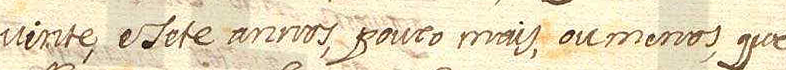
uinte, e sete annos, pouco mais, ou menos, que
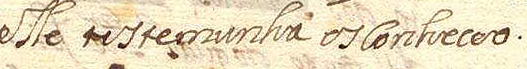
elle testemunha os conheceo.
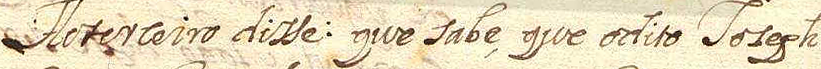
Ao terceiro disse: que sabe, que o dito Iozeph
